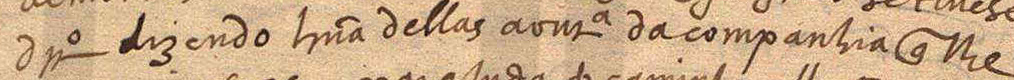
drro dizendo huā dellas a outa da companhia q̄ lhe
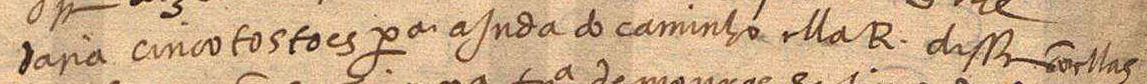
daria cinco tostoes ꝑa aJuda do caminho ella R. disse cō ellas
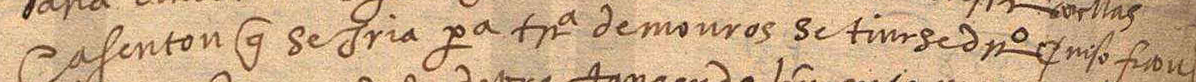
e asentou q̄ se Jria ꝑa trra de mouros se tiuese drro e niso ficou
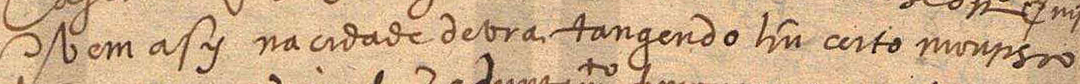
e vem asy na cidade devra tangendo hū certo mourisco
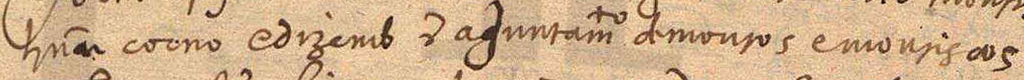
huū corno e dizendo ē aJuntamto de mouros e mouriscos
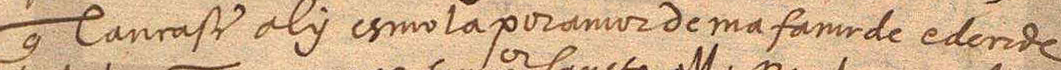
q̄ lançasē aly esmola por amor de mafamede e de cide
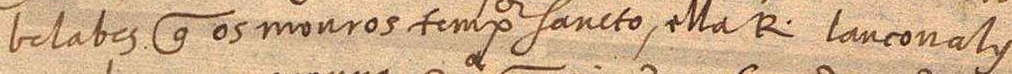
belabez q̄ os mouros tem po sancto, ella R. lançou aly
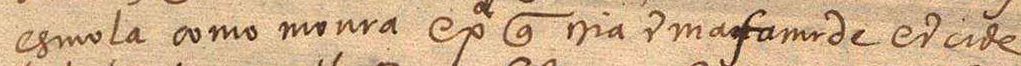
esmola como moura e pa q̄ cria ē mafamede e ē cide
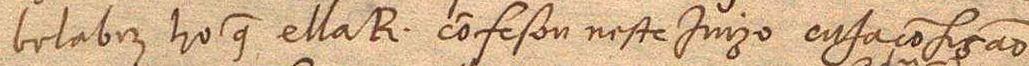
belabez ho q̄ ella R. cōfesou neste Juizo cuJa cōfisão
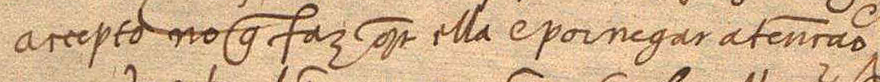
accepto no q̄ faz ꝯ̄t ella e por negar a tēnçao
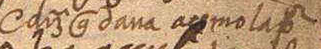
e diz̄ q̄ daua a esmola por
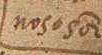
noso sōr
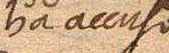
ha accuso
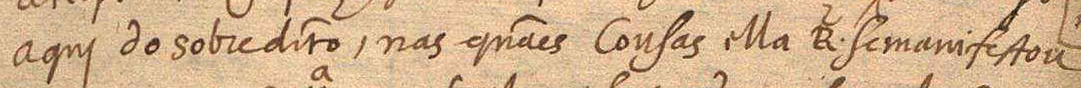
aquj do sobredito, nas quaes Cousas ella R. se manifestou
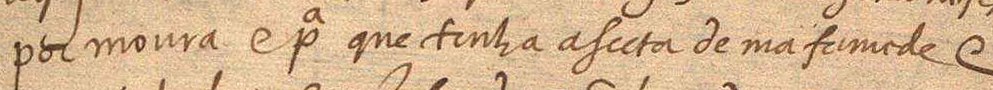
por moura e pa que tinha a secta de mafamede e
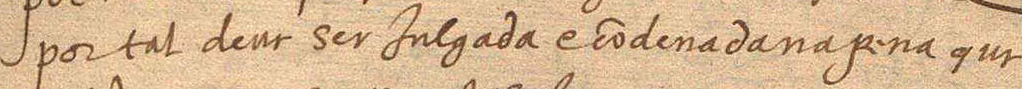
por tal deue ser Julgada e cōdenada na pena que
